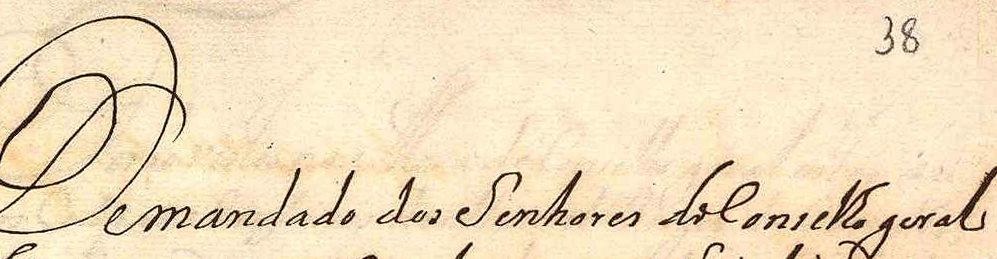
De mandado dos Senhores do Conselho geral
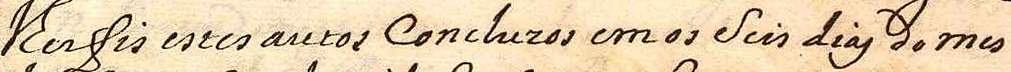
lhes fis estes autos Concluzos em os Seis dias do mes
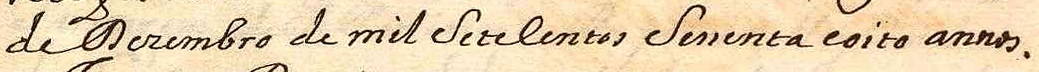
de Dezembro de mil SeteCentos Sessenta e oito annos.
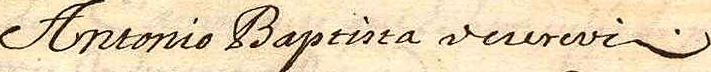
Antonio Baptista o escrevi.
